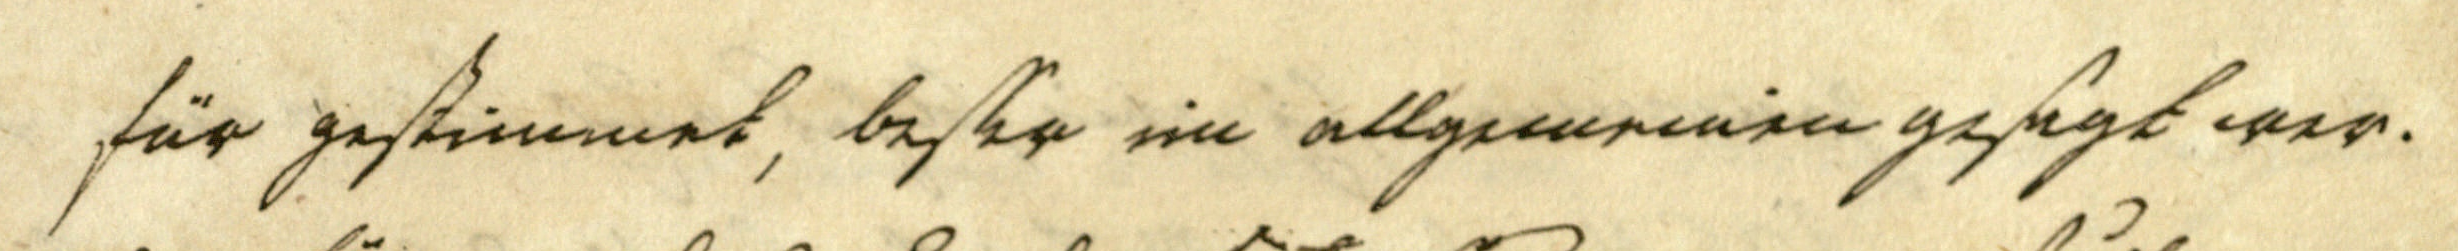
für gestimmet, besser im allgemeinen gesagt wer¬
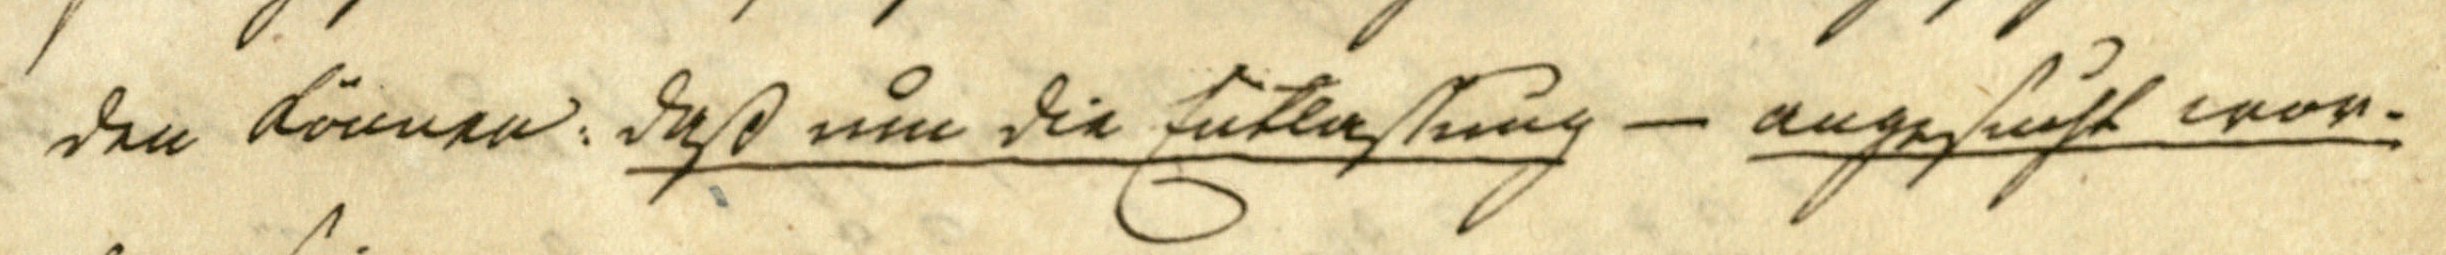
den können: daß um die Entlassung - angesucht wor¬
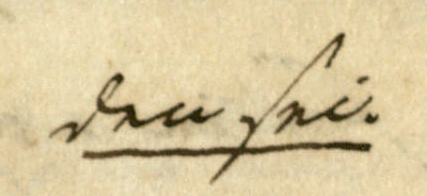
den sei.
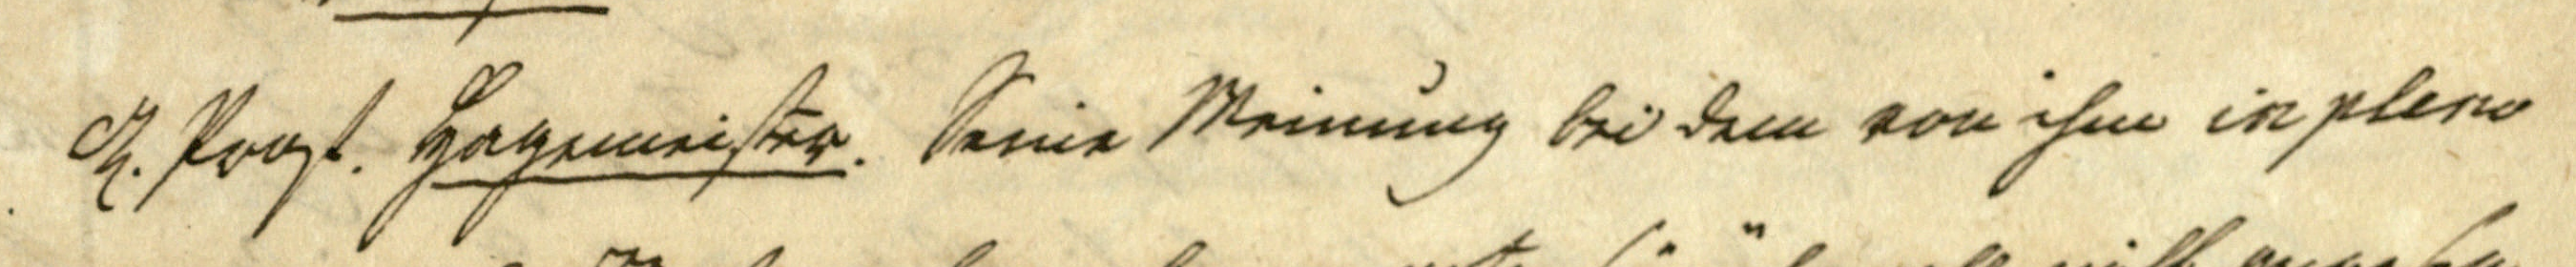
dh. Prof. Hagemeister. Seine Meinung bei dem von ihm in pleno
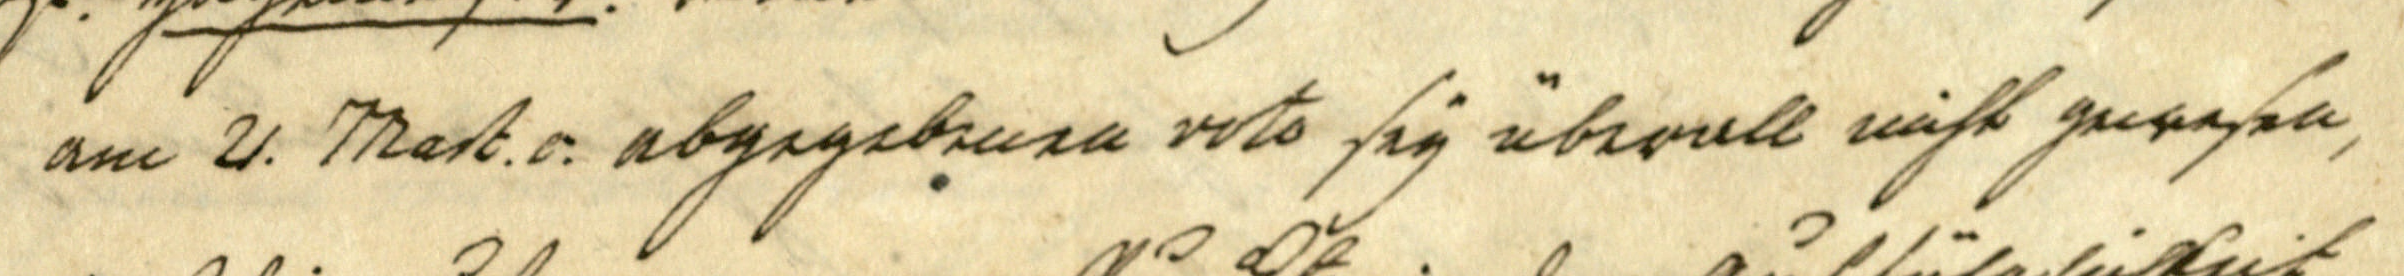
am 21. Mart. c. abgegebenen voto seÿ überall nicht gewesen,
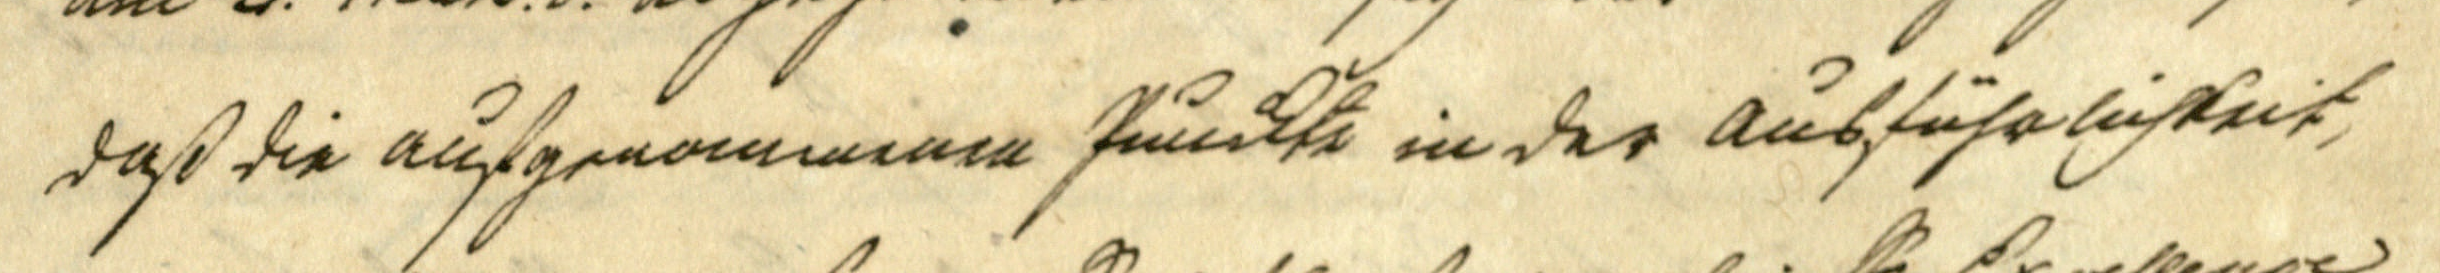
daß die aufgenommenen Punckte in der Ausführlichkeit,
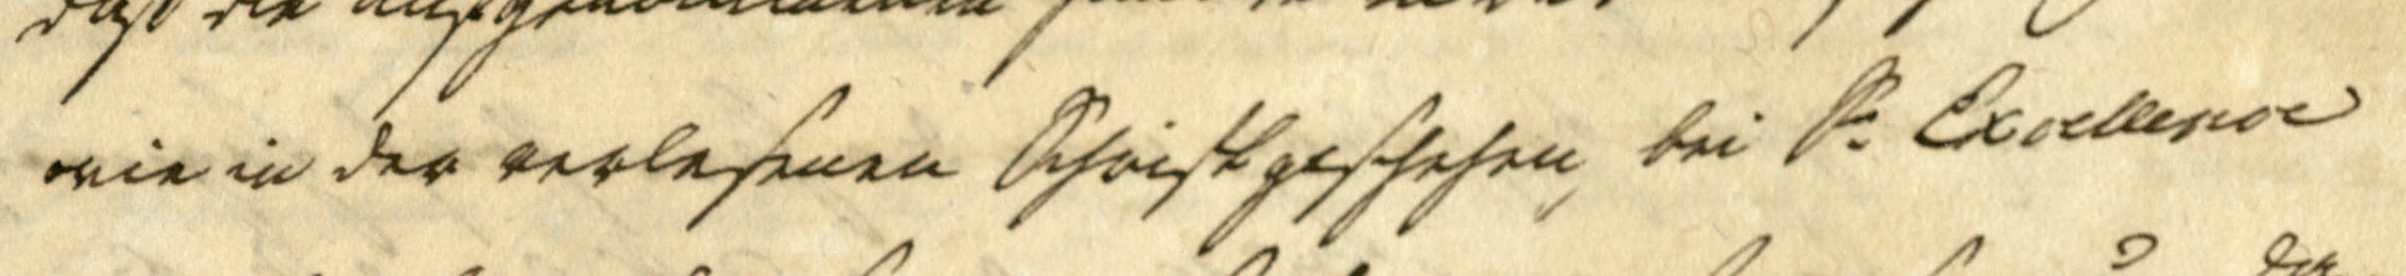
wie in der verlesenen Schrift geschehen bei Sr. Excellence
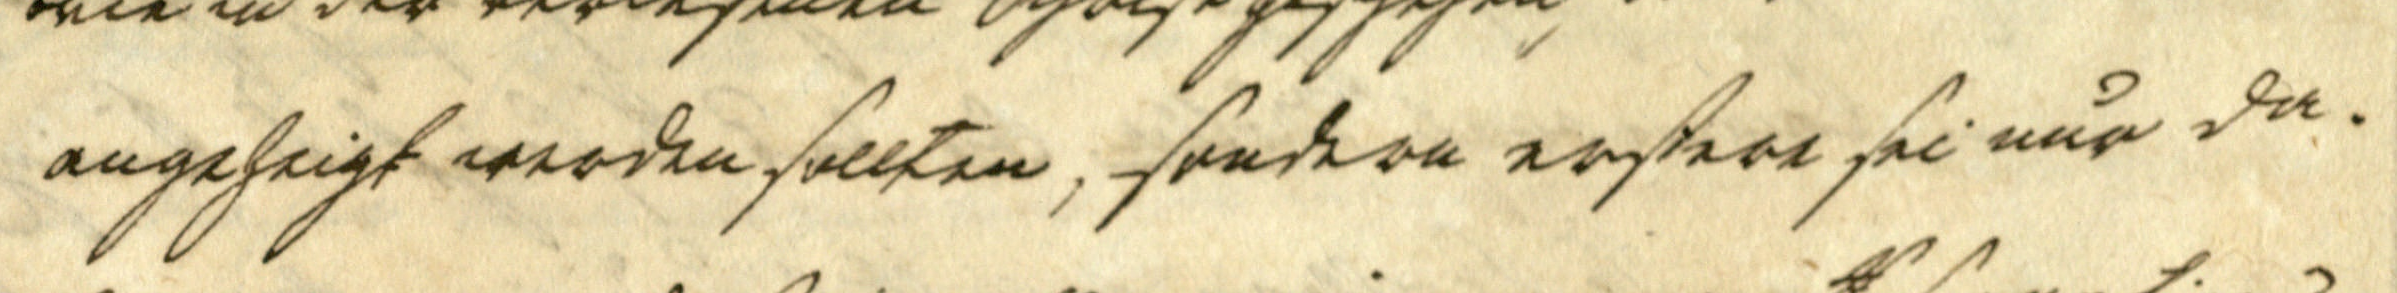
angezeigt werden sollten, sondern erstere sei nur da¬
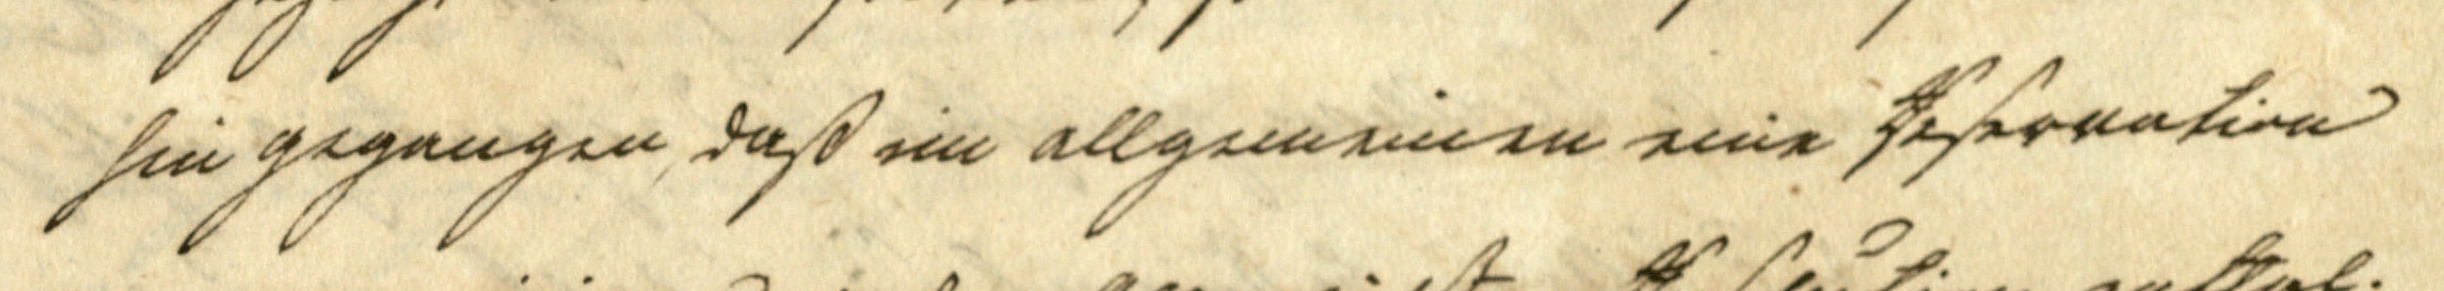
hin gegangen, daß im allgemeinen eine Reservation
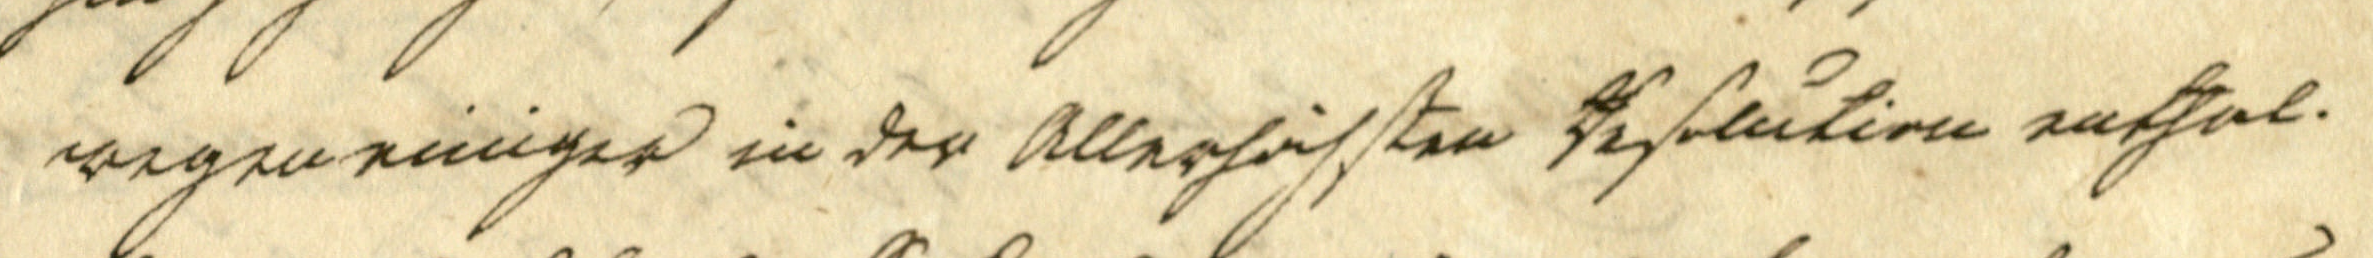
wegen einiger in der Allerhöchsten Resolution enthal-
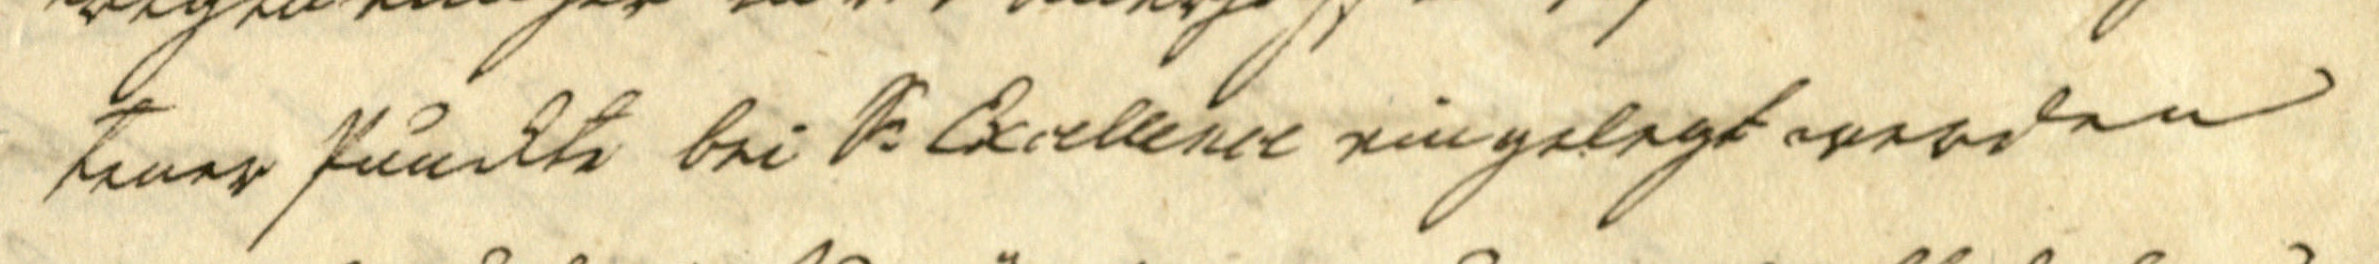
tener Punckte bei Sr Excellence eingelegt werden
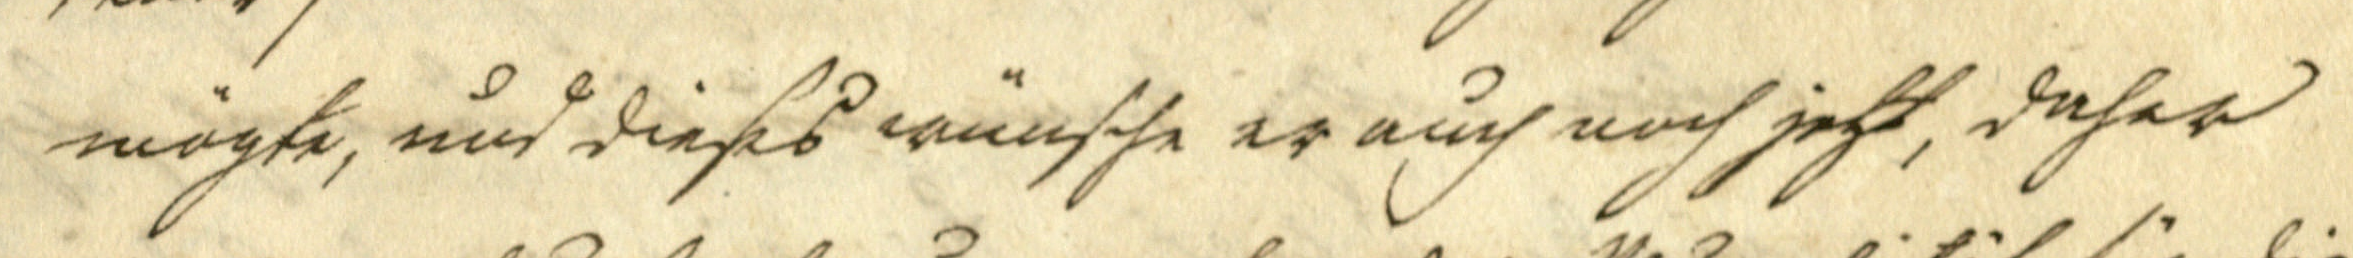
mögte, und dieses wünsche er auch noch jetzt, daher
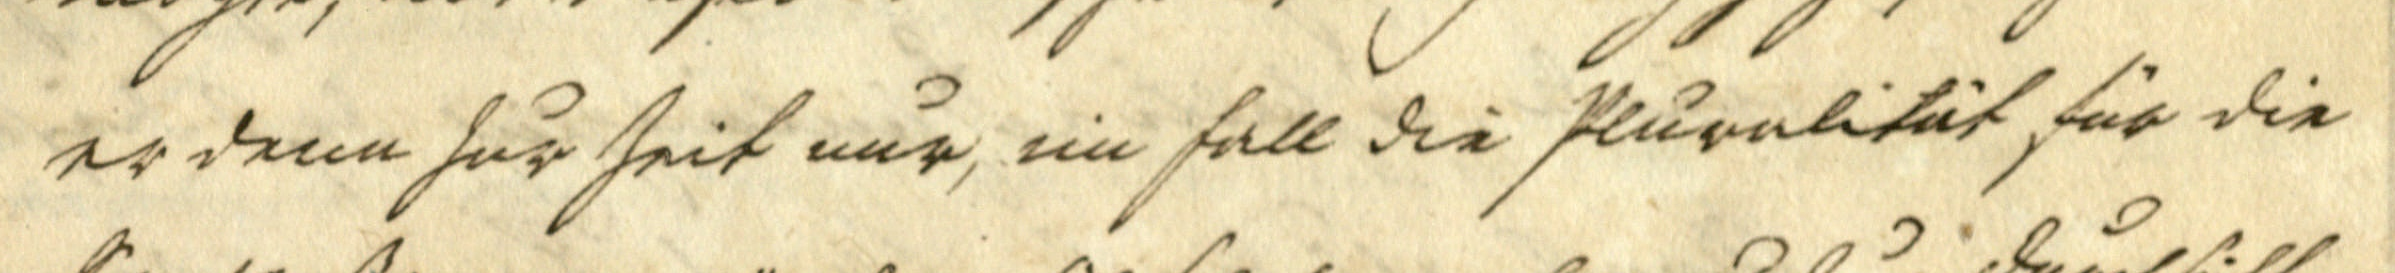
er denn zur Zeit nur, im Fall die Pluralität für die
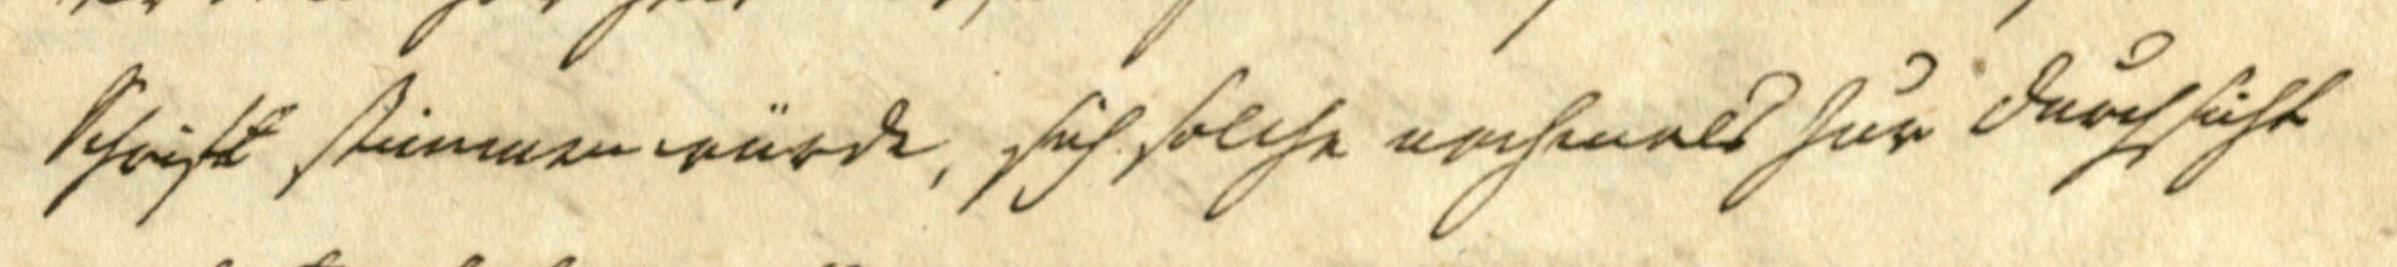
Schrift stimmen würde, sich solche nochmals zur Durchsicht
